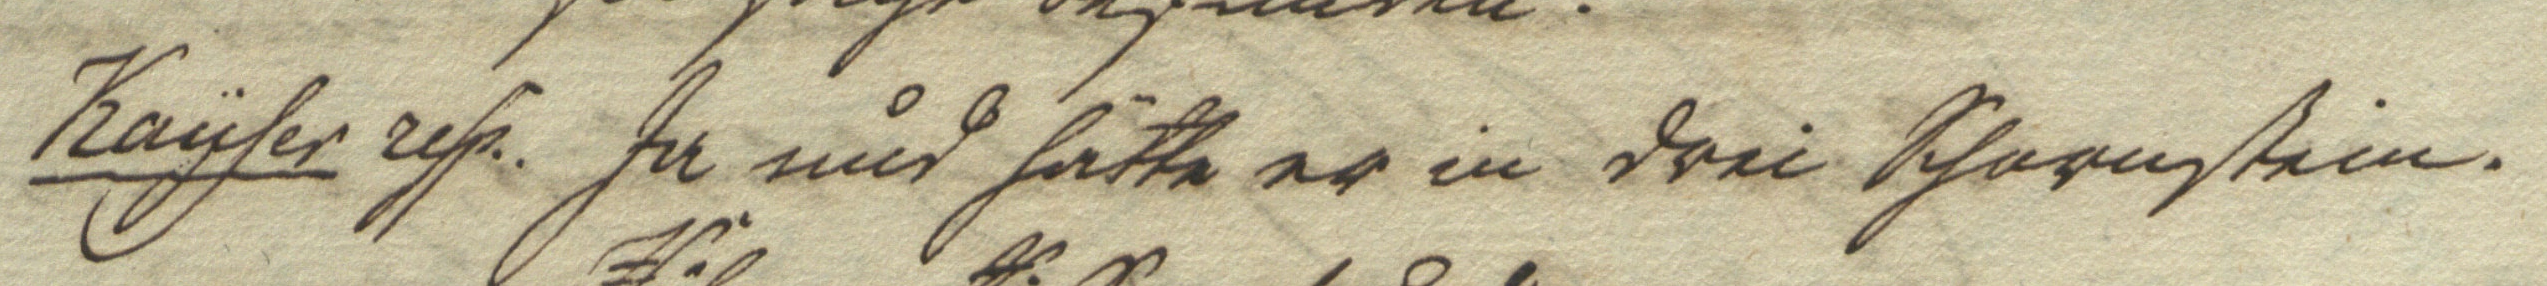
Kaÿser ref. Ja und hätte er in drei Schornstein¬
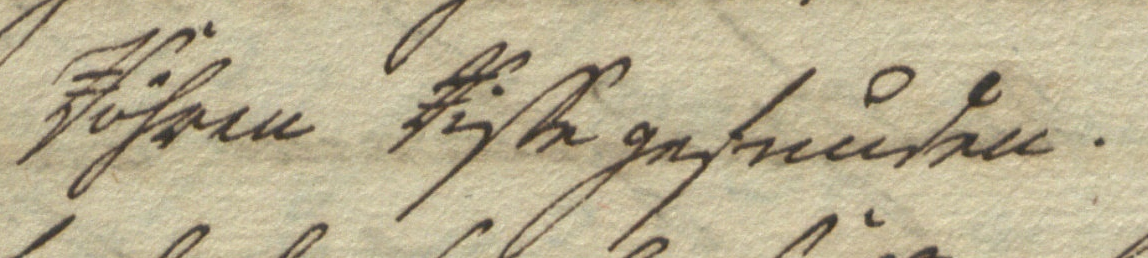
Röhren Risse gefunden.
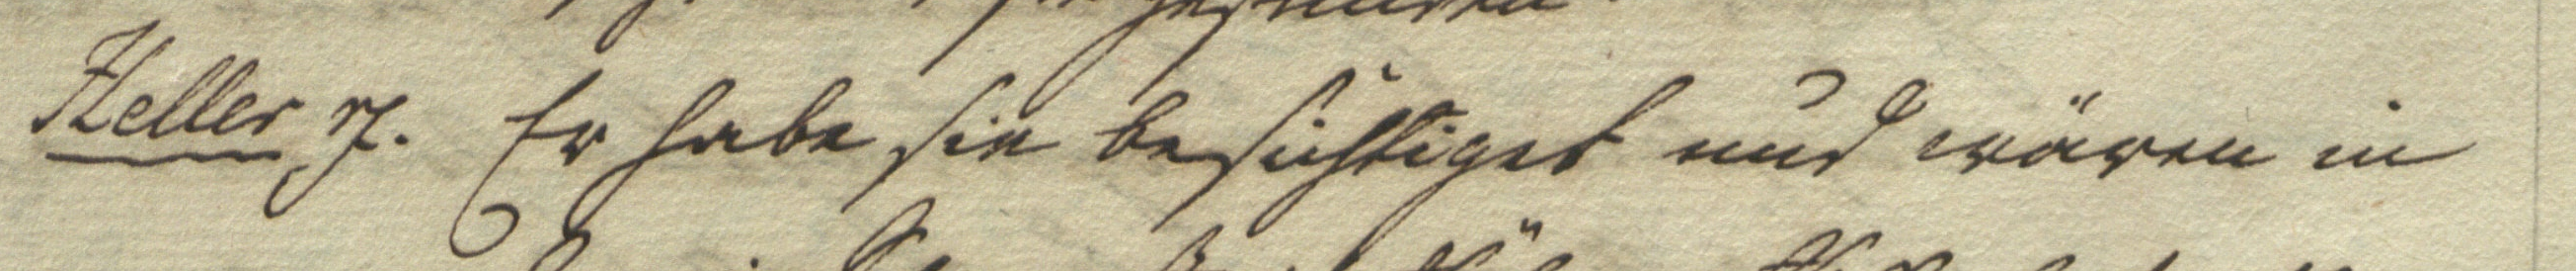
Heller rf. Er habe sie besichtiget und wären in
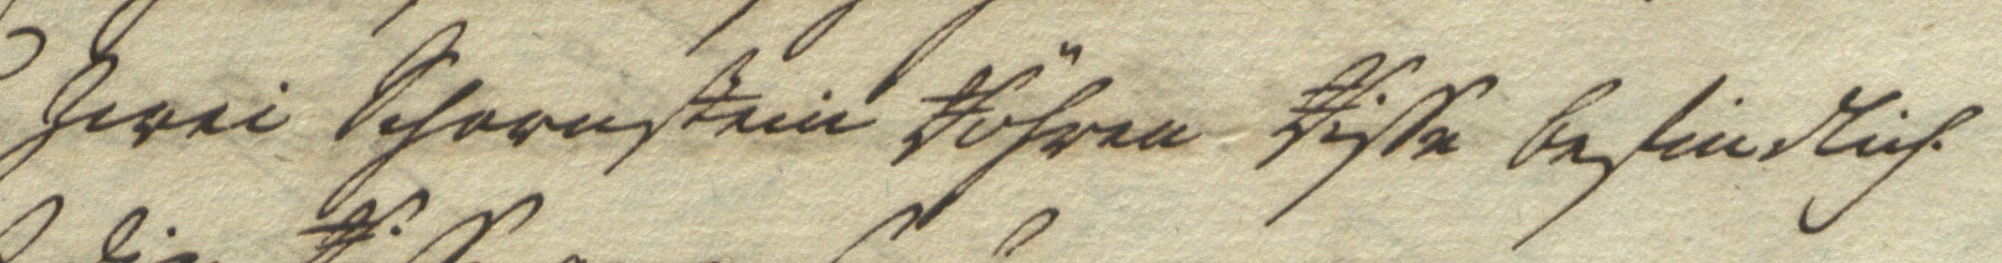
zwei Schornstein Röhren Risse befindlich
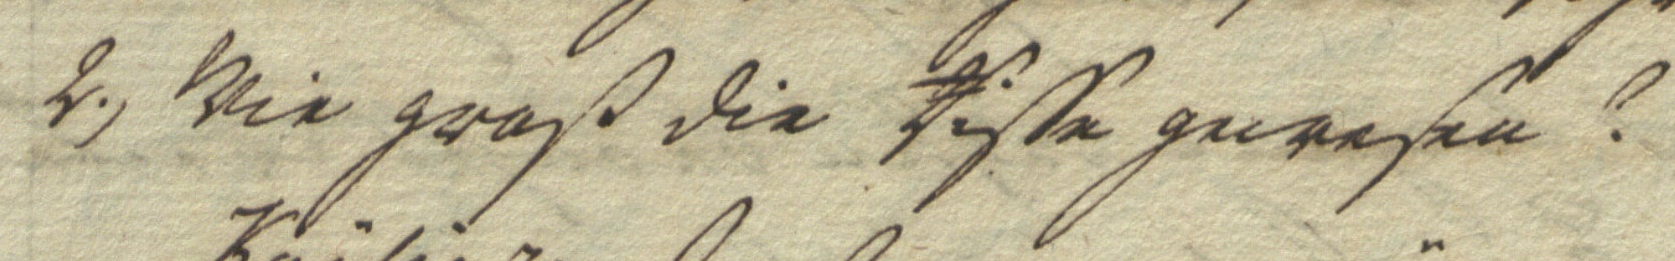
2., Wie groß die Risse gewesen?
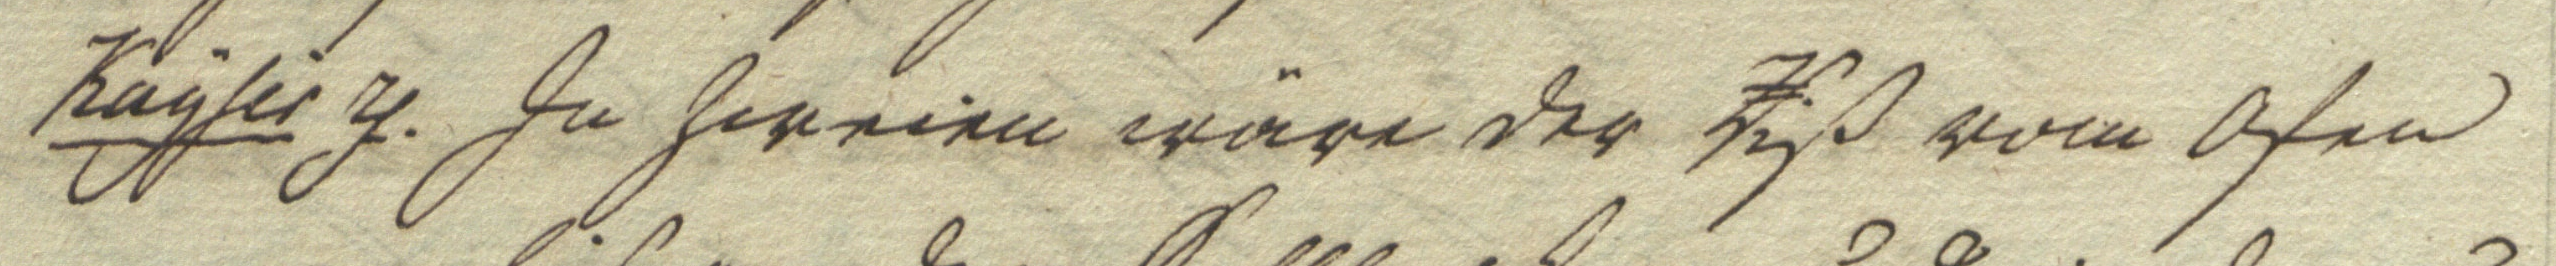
Kaÿser. rf.. In zweien wäre der Riß vom Ofen
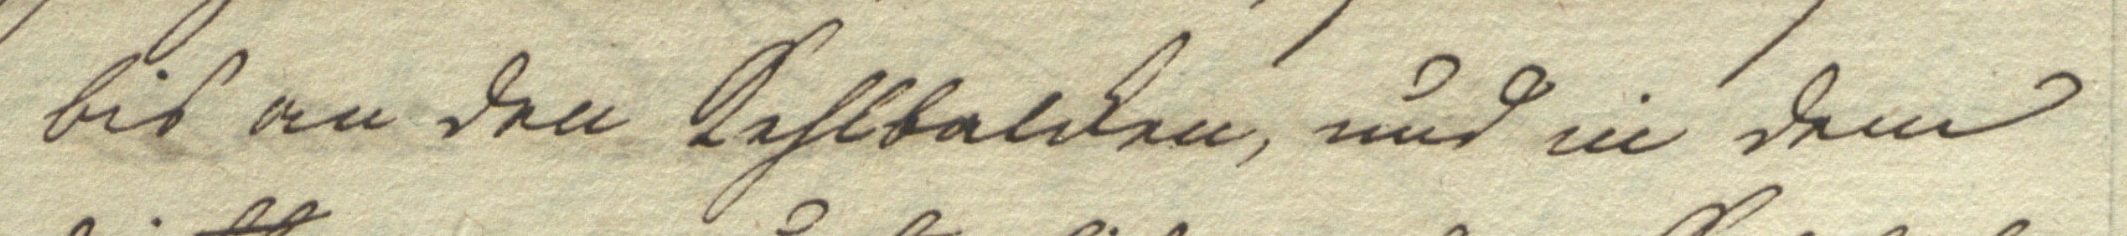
bis an den Kehlbalcken, und in dem
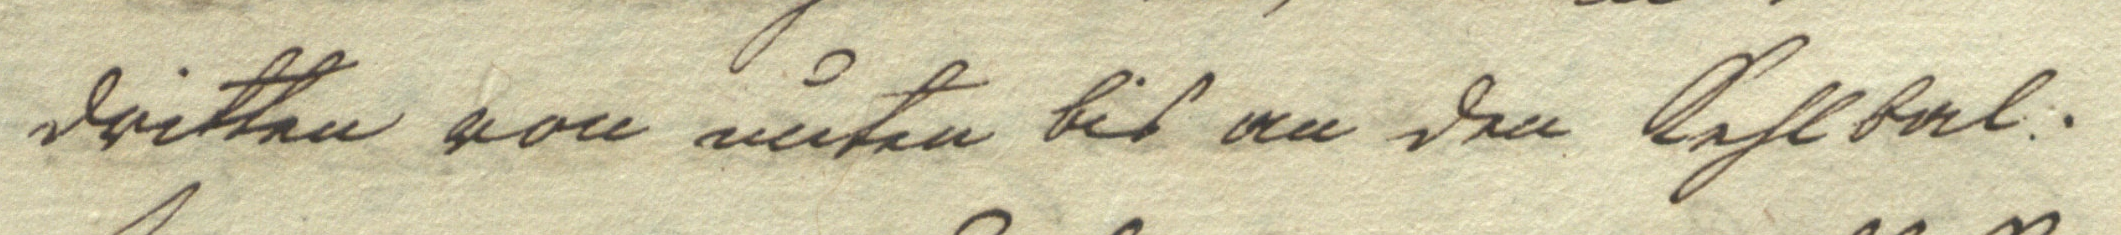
dritten von unten bis an den Kehlbal¬
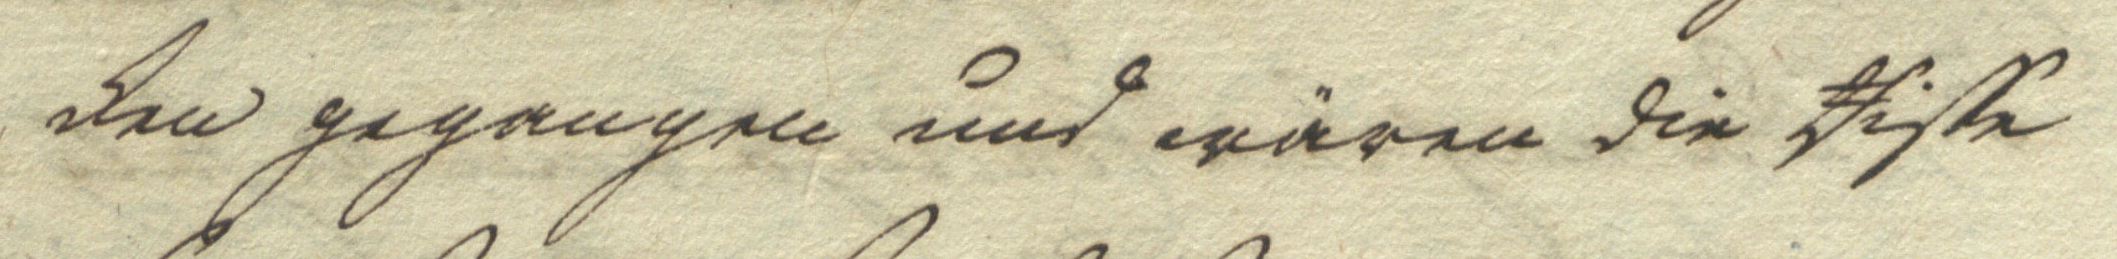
ken gegangen und wären die Risse
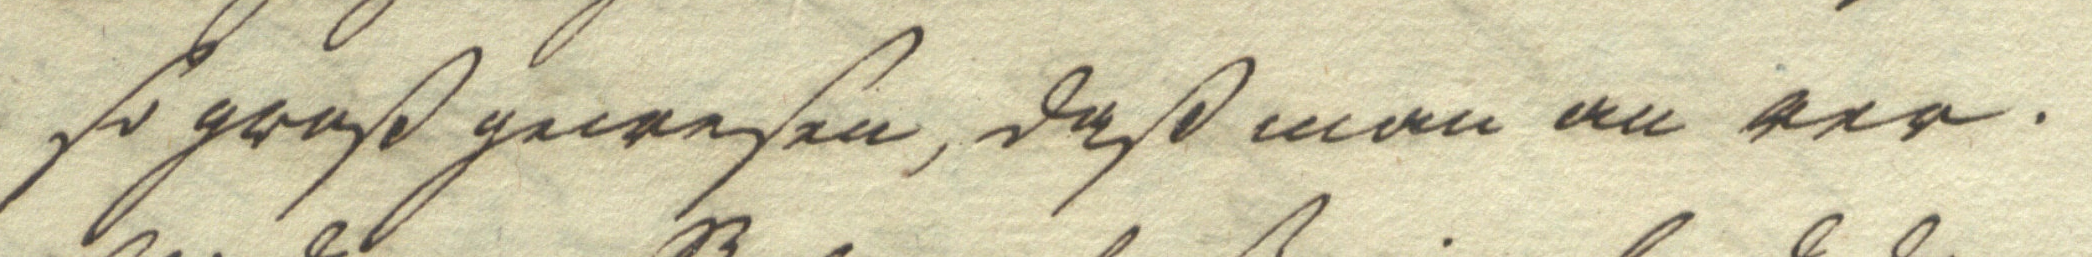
so groß gewesen, daß man an ver¬
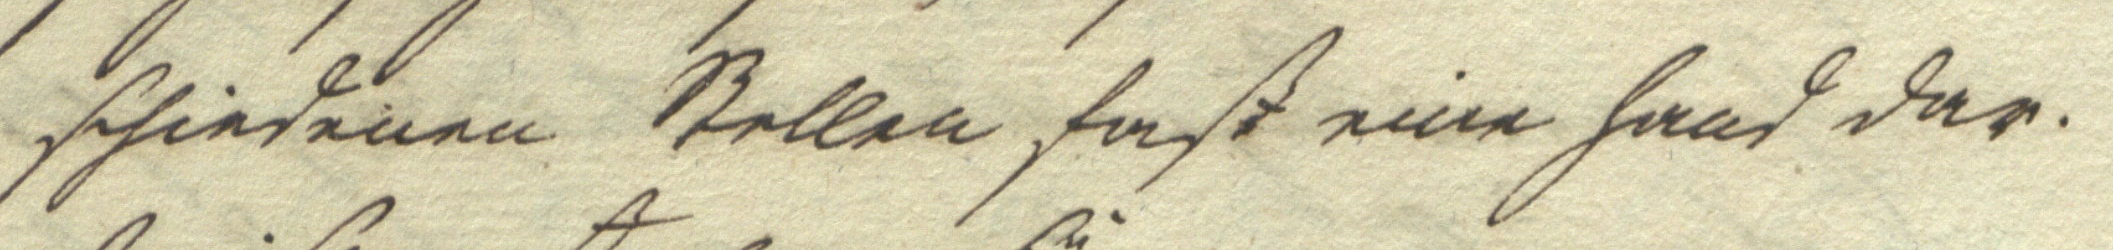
schiedenen Stellen fast eine Hand dar¬
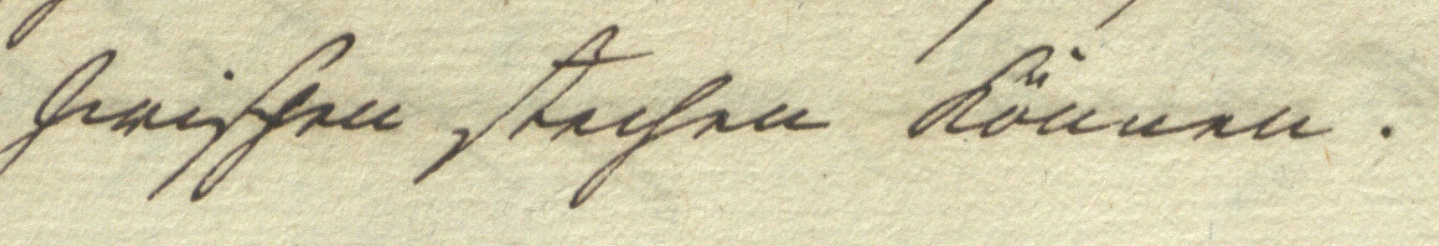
zwischen stechen können.
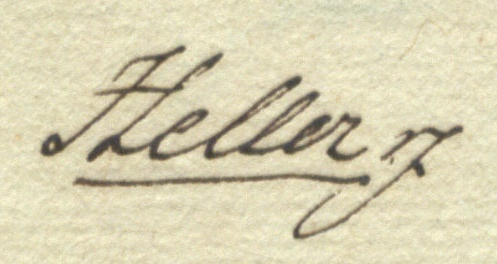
Heller rf
